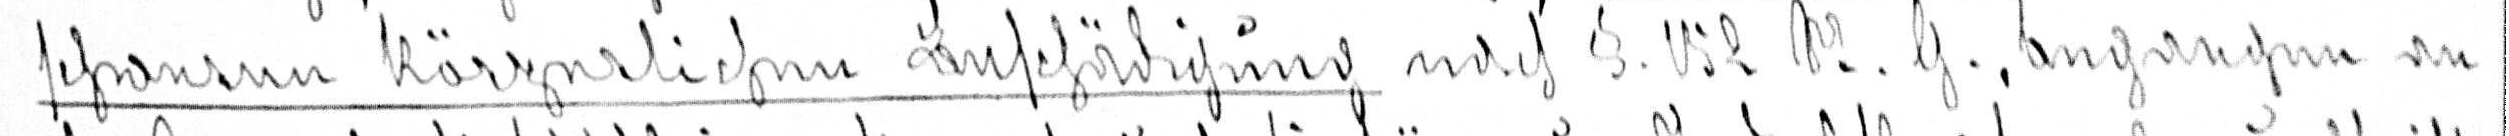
schweren körperlichen Beschädigung nach § 152 St. G. begangen an
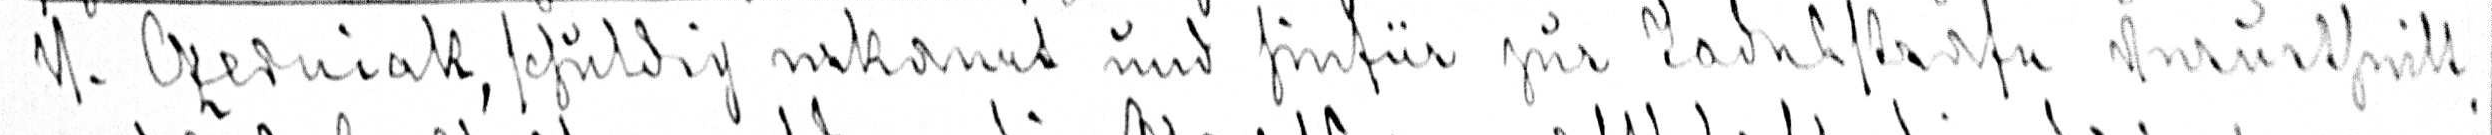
V. Czedniak, schuldig erkannt und hiefür zur Todesstrafe verurtheilt
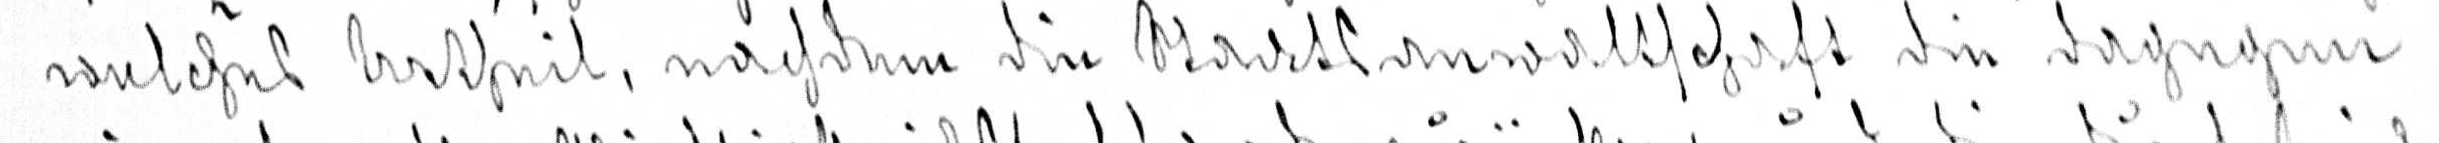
welches Urtheil, nachdem die Staatsanwaltschaft die dagegen
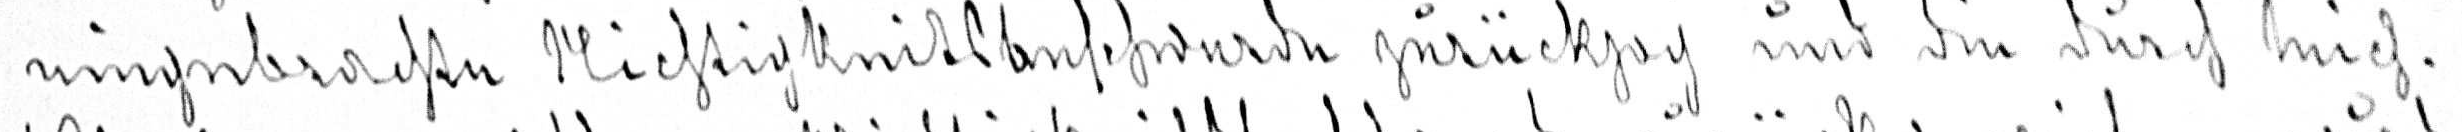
eingebrachte Nichtigkeitsbeschwerde zurückzog und die durch Mich.
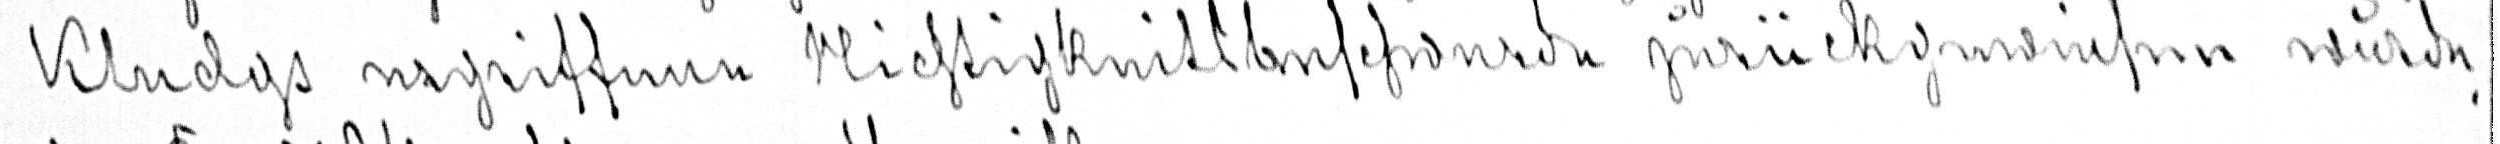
Kludys ergriffene Nichtigkeitsbeschwerde zurückgewiesen wurde
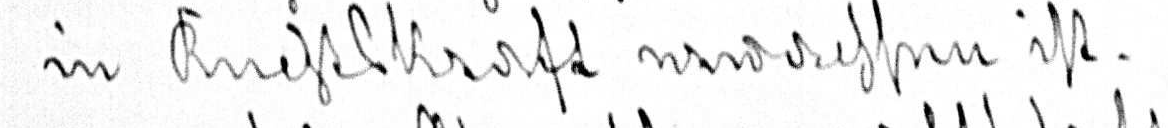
in Rechtskraft erwachsen ist.
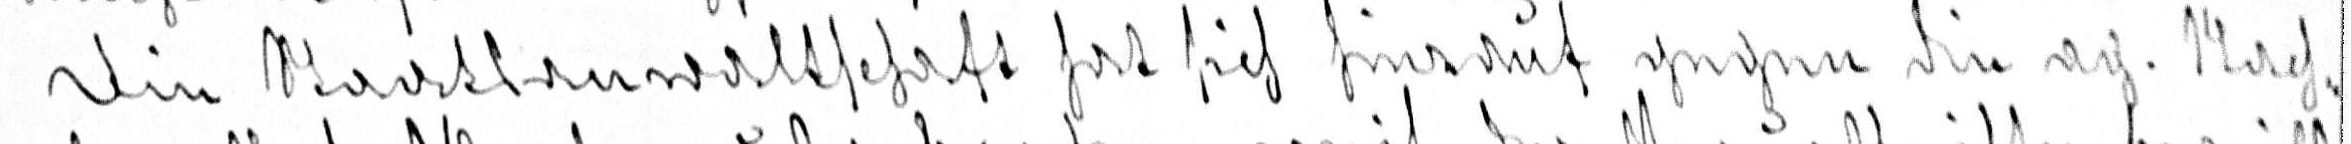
Die Staatsanwaltschaft hat sich hierauf gegen die ag. Nach¬
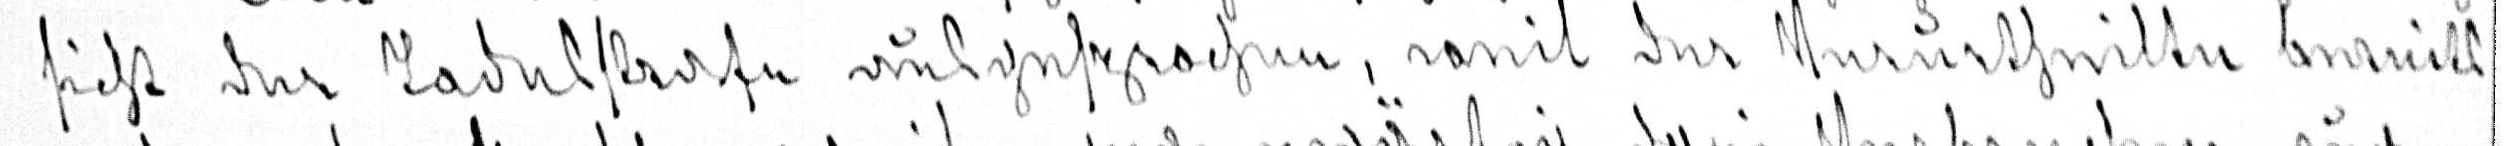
sicht der Todesstrafe ausgesprochen, weil der Verurtheilte bereits
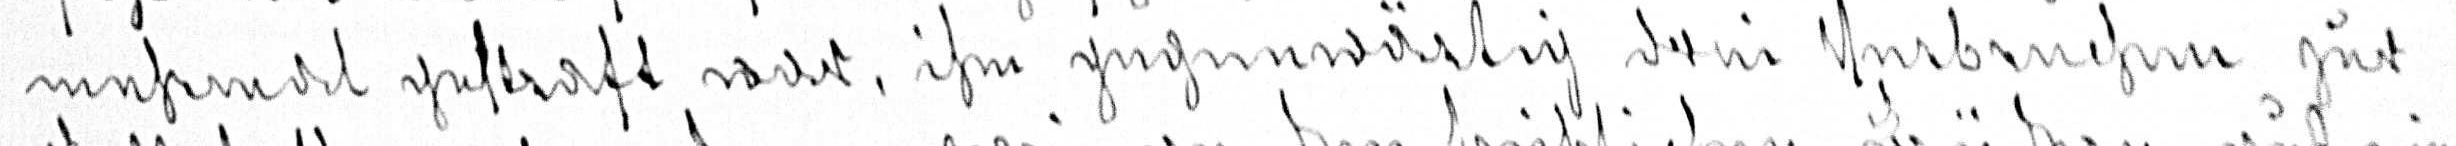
mehrmal gestraft war, ihm gegenwärtig drei Verbrechen zur
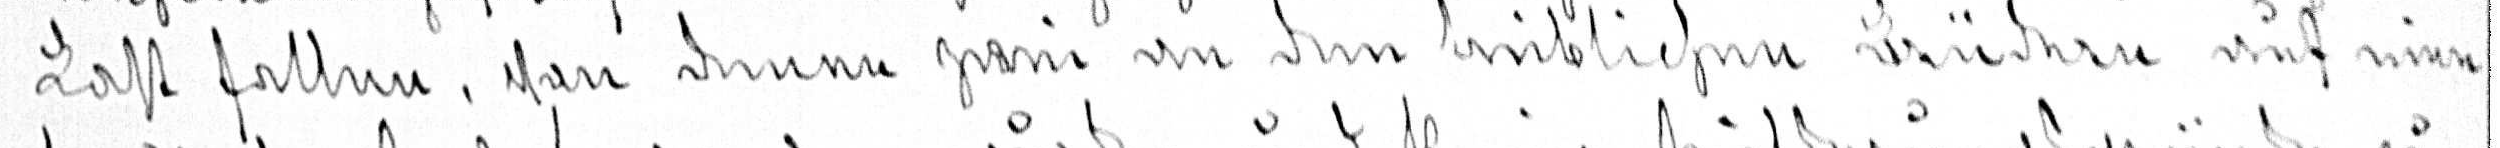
Last fallen, von denen zwei an den leiblichen Brüder auf eine
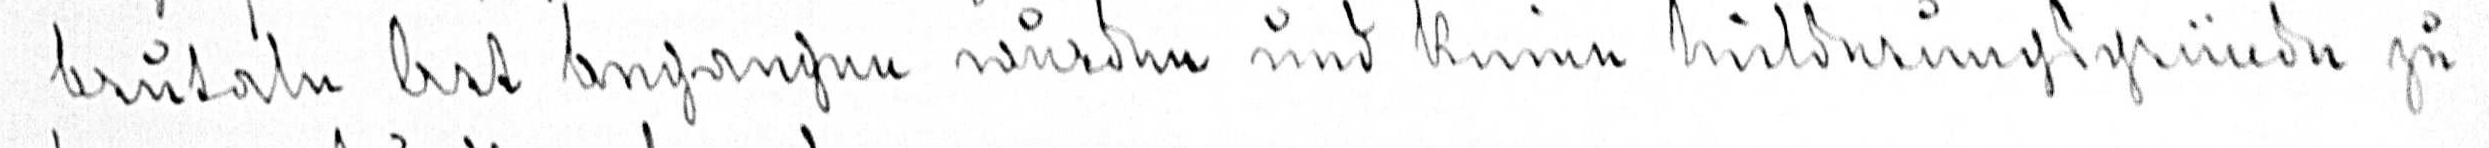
brutale Art begangen wurden und keine Milderungsgründe zu
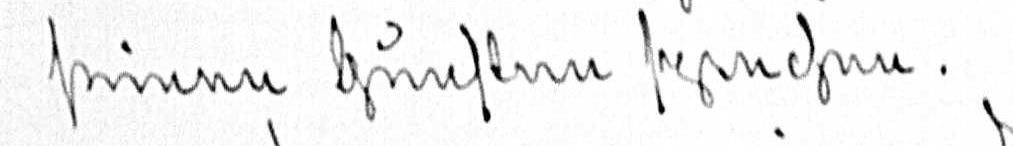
seinen Gunsten sprechen.
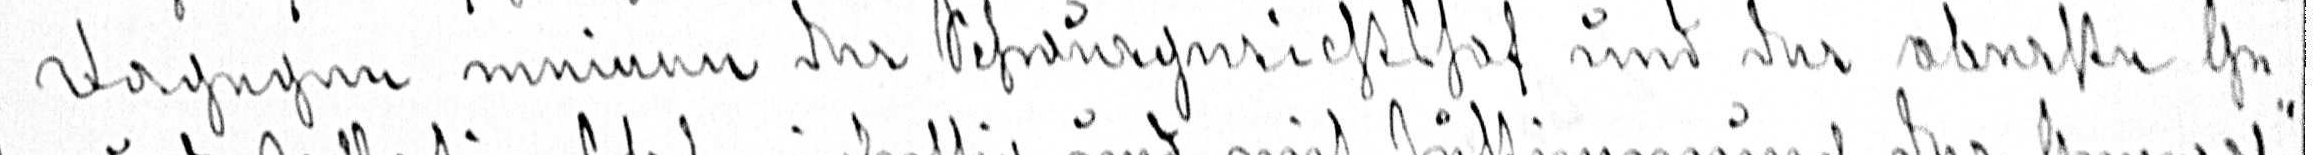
Dagegen meinen der Schwurgerichtshof und der oberste Ge¬
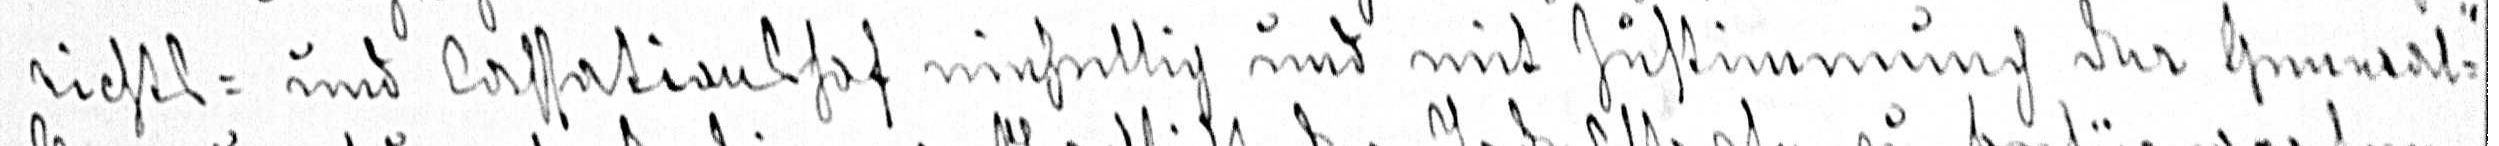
richts- und Cassationshof einhellig und mit Zustimmung der General¬
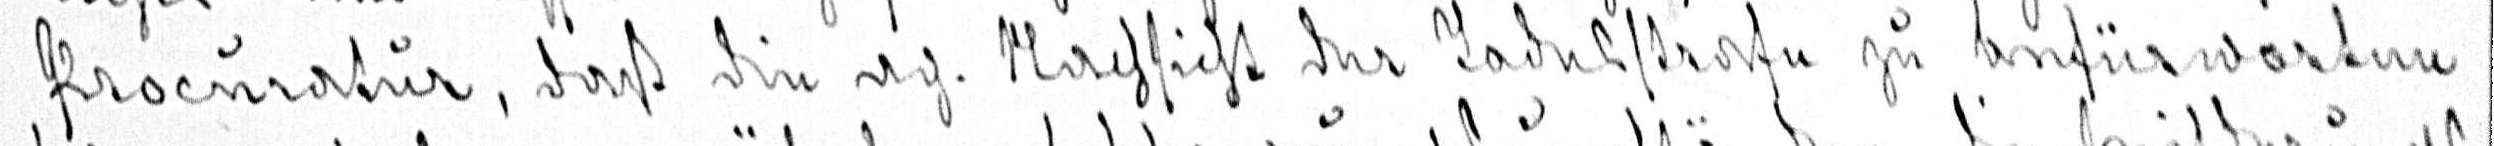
procuratur, daß die ag. Nachsicht der Todesstrafe zu befürworten
